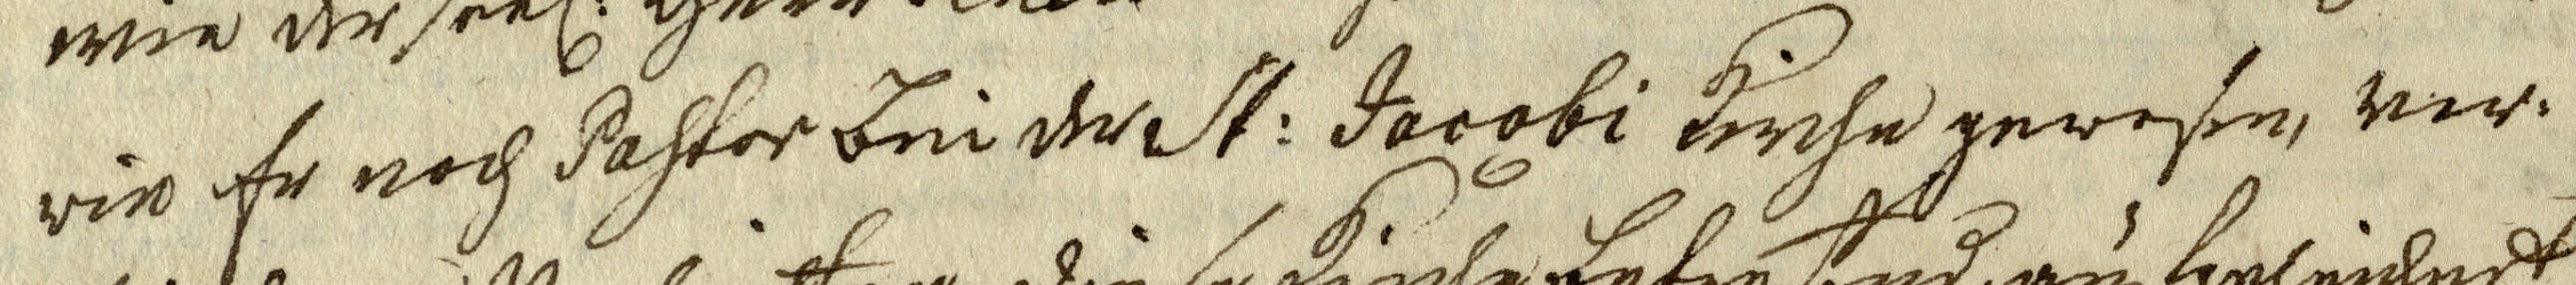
wie Er noch Pastor bei der St. Jacobi Kirche gewesen, ver¬
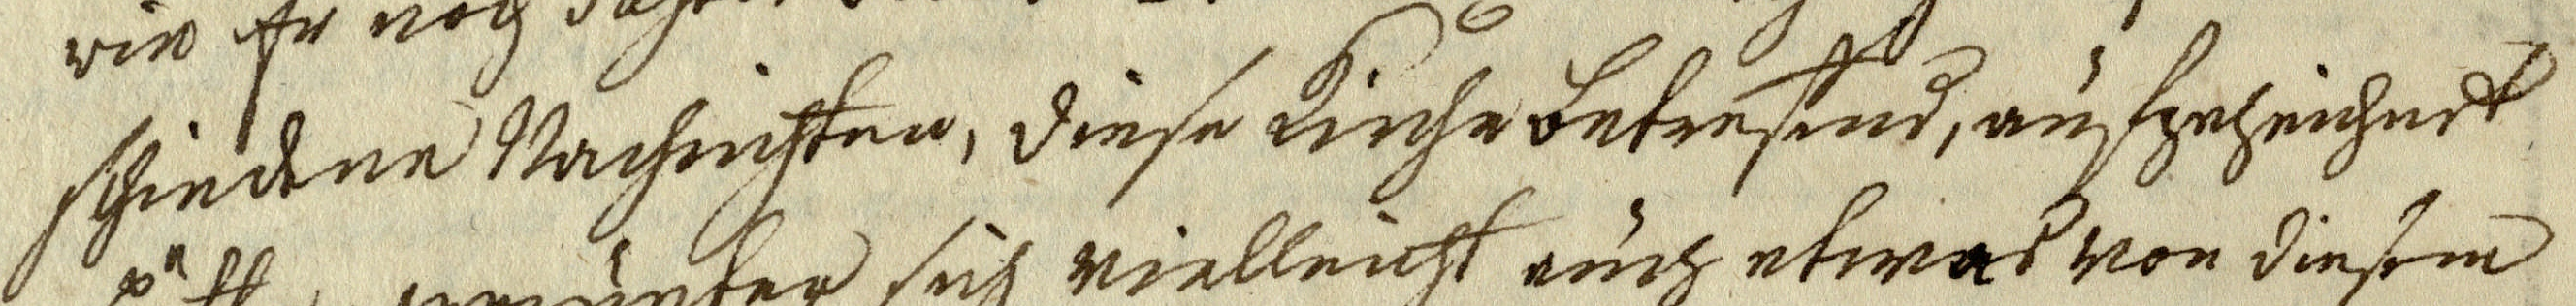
schiedene Nachrichten, diese Kirche betreffend, aufgezeichnet
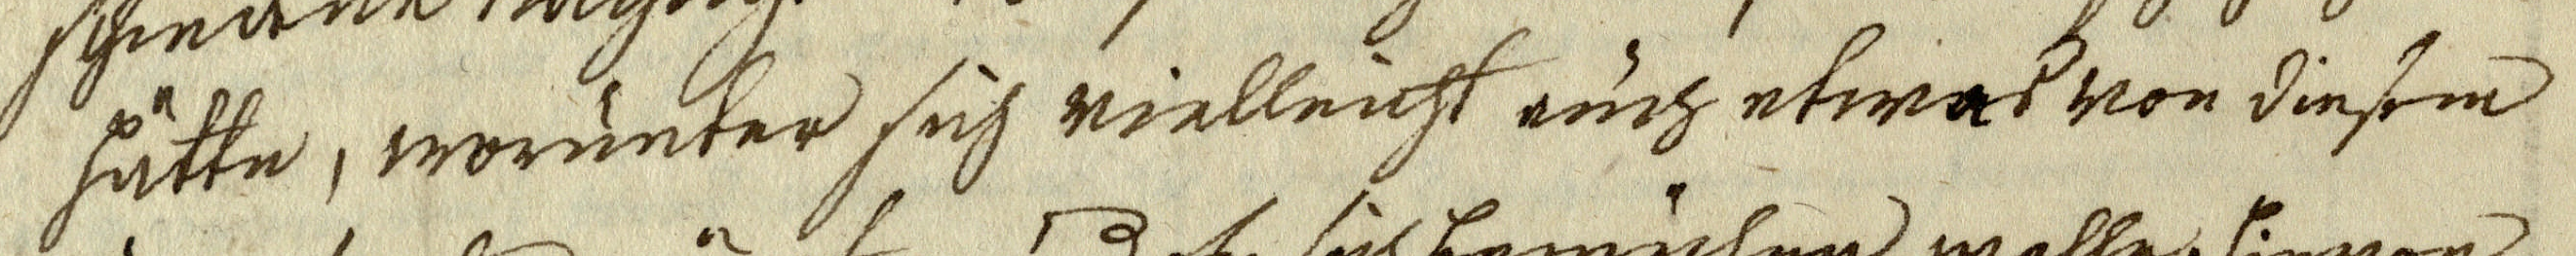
hätte, worüber sich vielleicht auch etwas von diesem
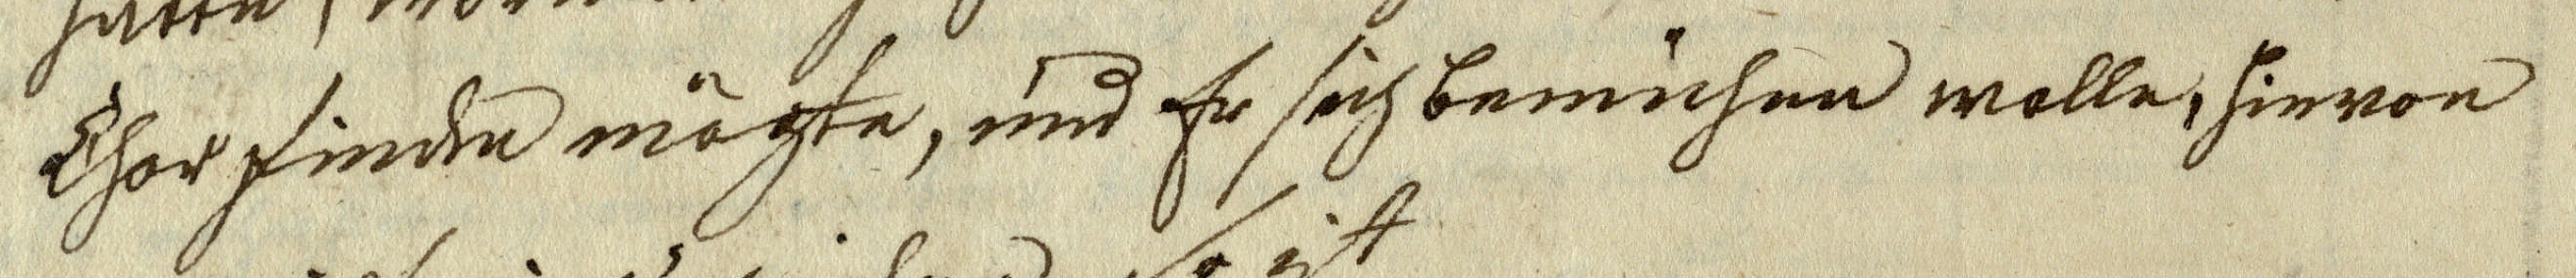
Chor finden mögte, und Er sich bemühen wolle, hievon
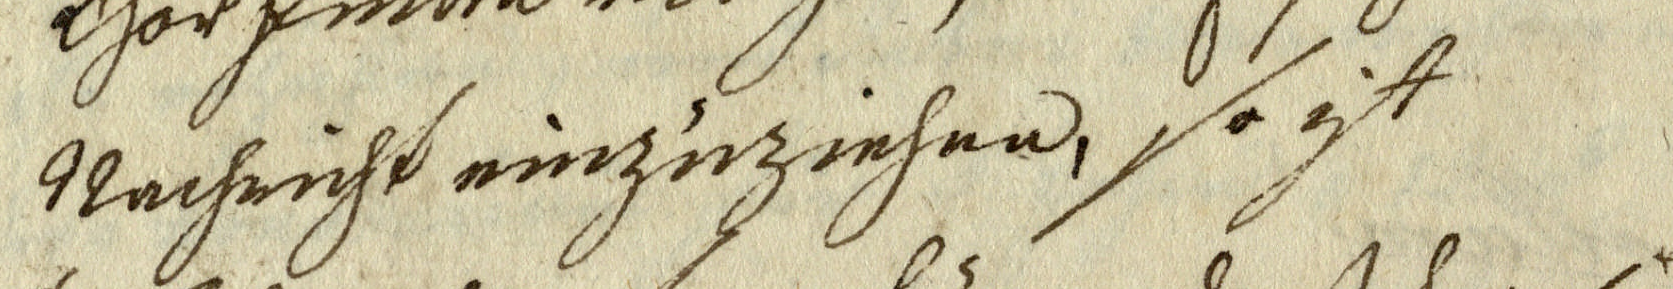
Nachricht einzuziehen, so ist
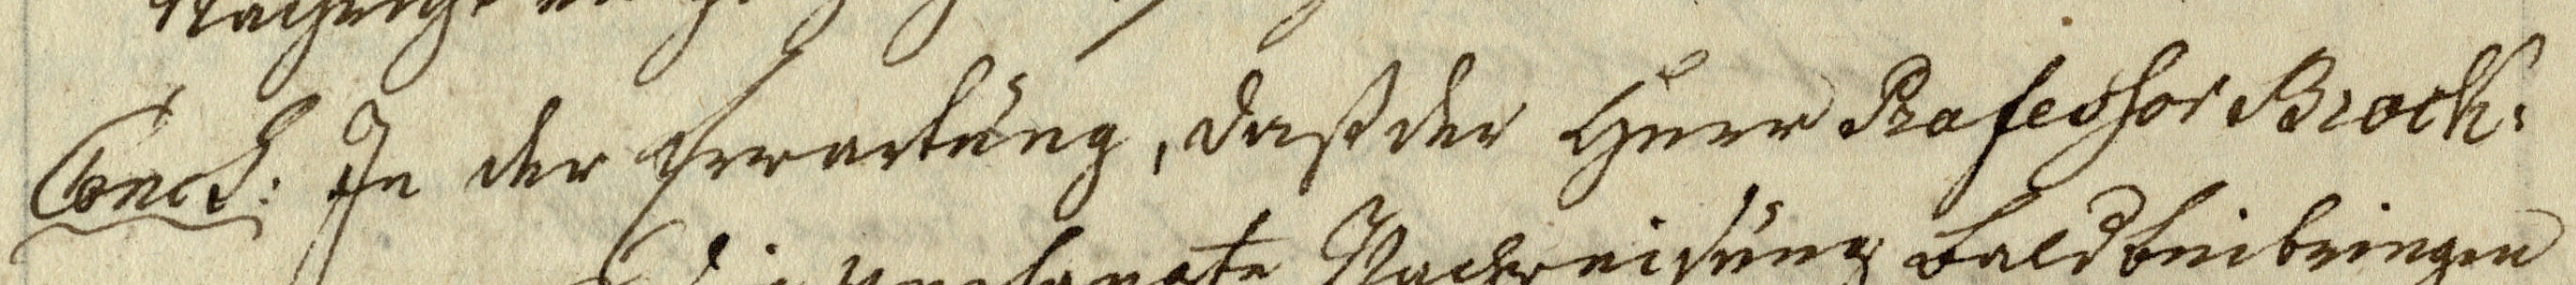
Concl. In der Erwartung, daß der Herr Professor Brock¬
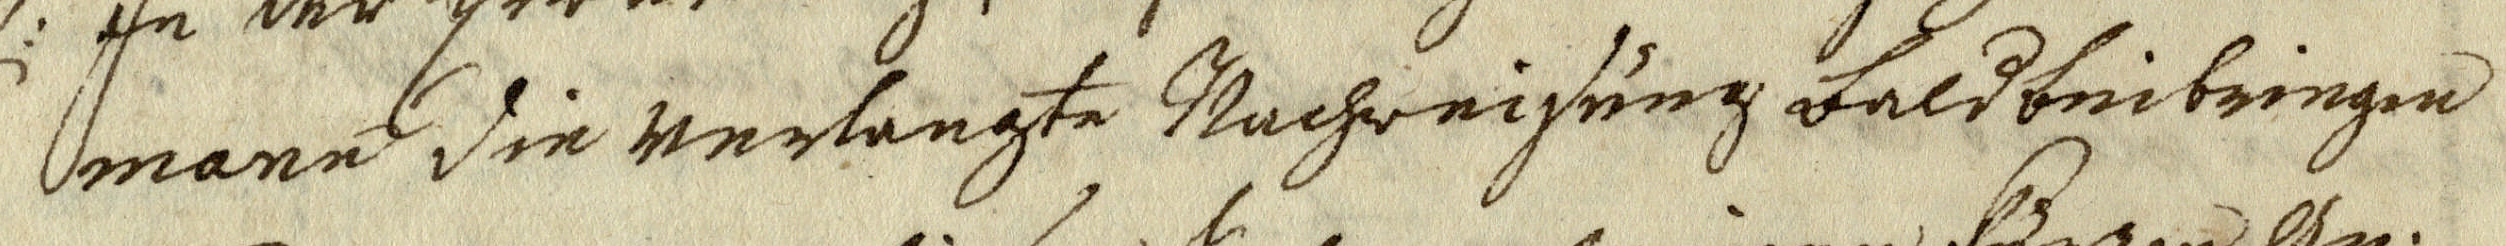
mann die verlangte Nachweisung bald beibringen
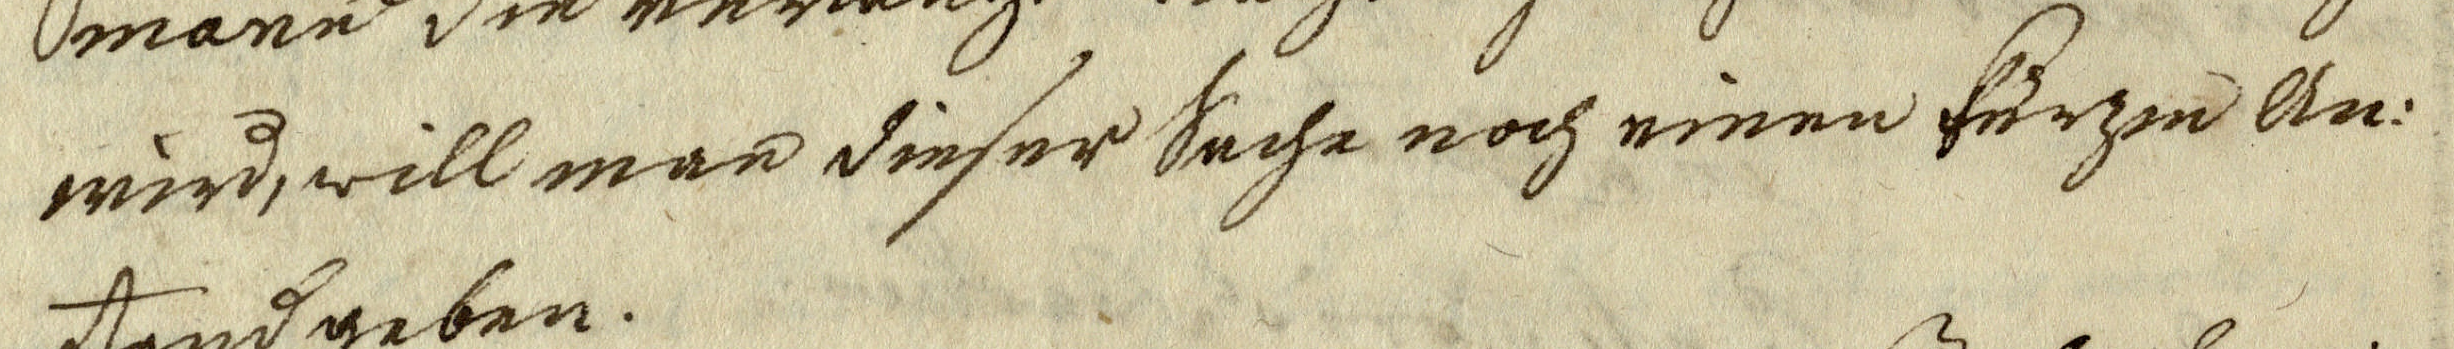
wird, will man dieser Sache noch einen kurzen An¬
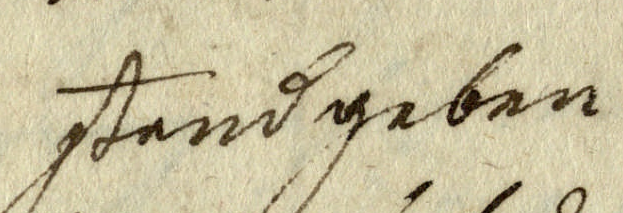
stand geben.
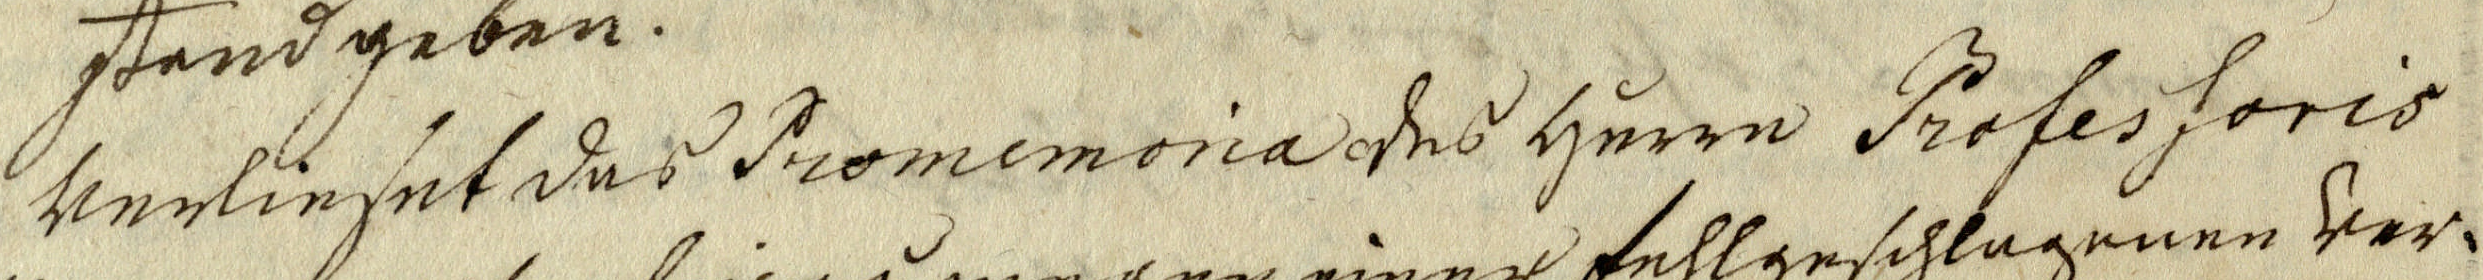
3. Verlieset das Promemoria des Herrn Professoris
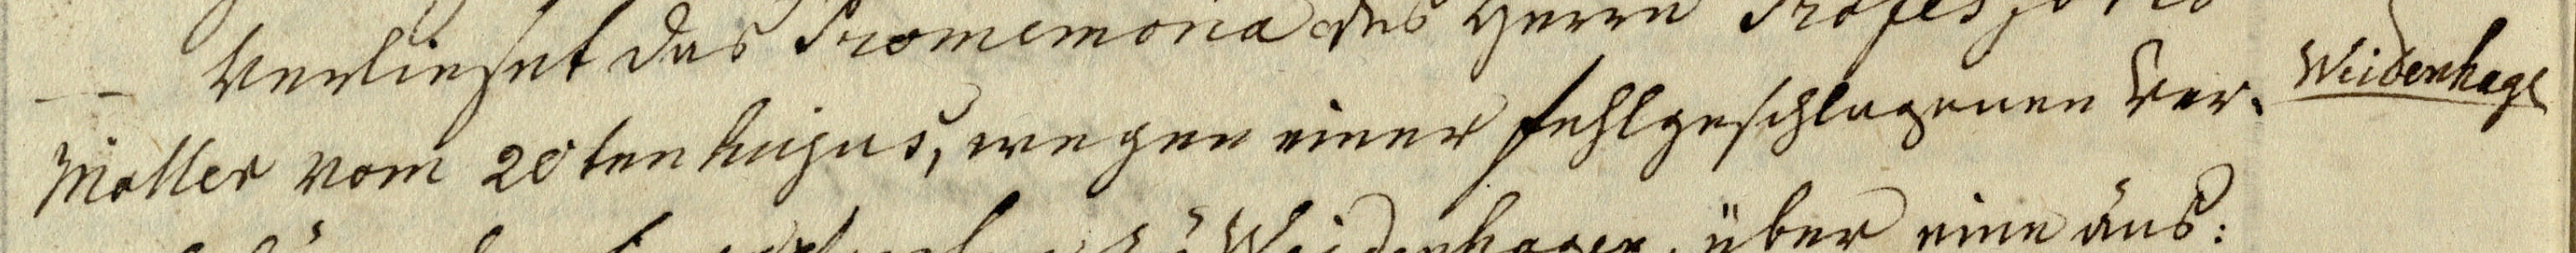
Möller vom 20ten hujus, wegen einer fehlgeschlagenen Ver¬ Weidenhagen
